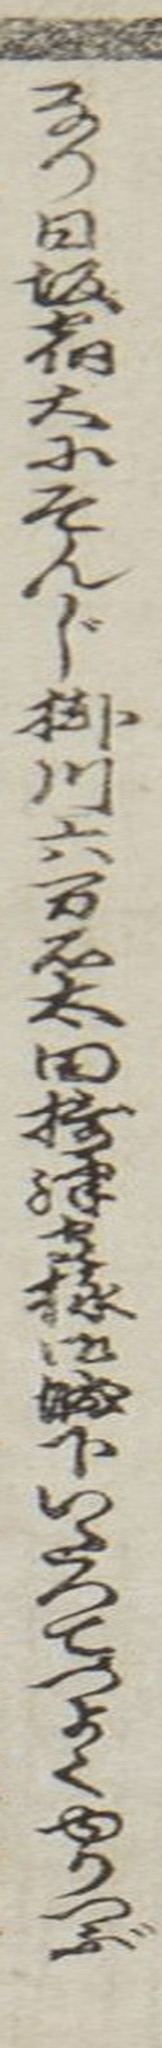なり日坂宿大にそんじ掛川六万石太田摂津守様御城下いたつてつよくゆりつぶ
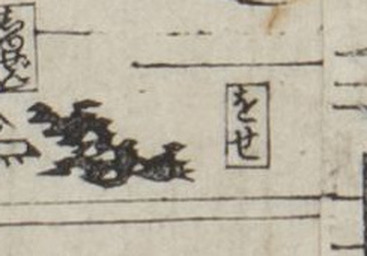かれる
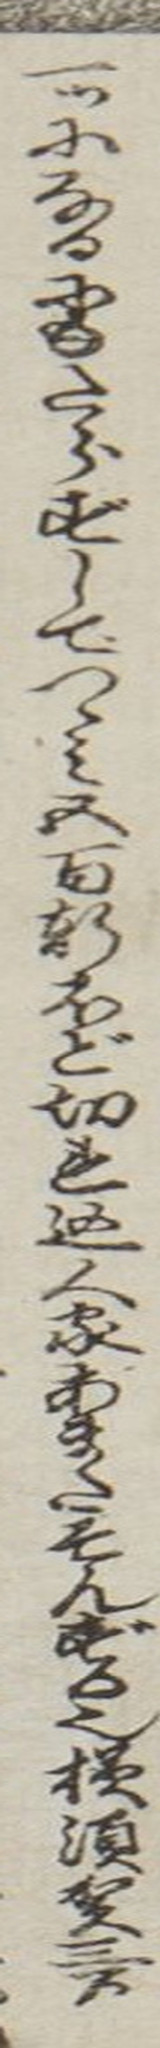一ツになるにもたらずしてつゝみ五百軒ほど切れ込人家あまたそんずる也横須賀三万
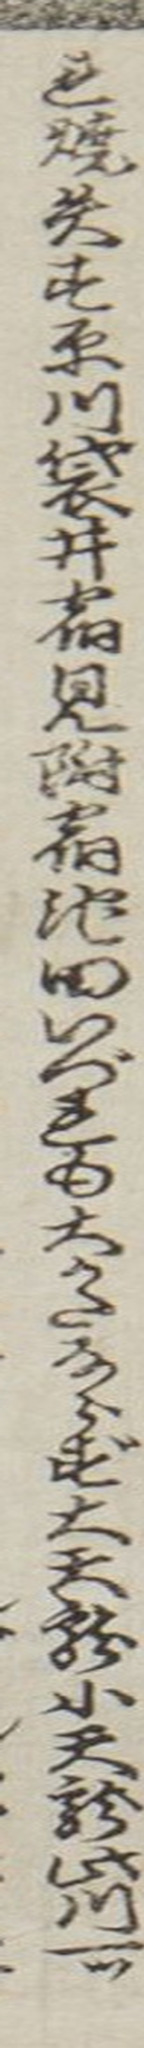れ焼失す原川袋井宿見附宿池田いづれも大かたならず大天龍小天龍此川一ツ
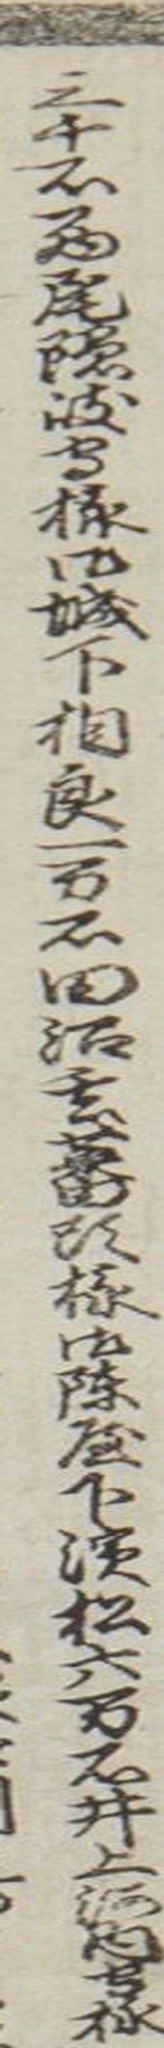三千石西尾隠岐守様御城下相良一万石田沼玄蕃頭様御陣屋下浜松六万石井上河内守様
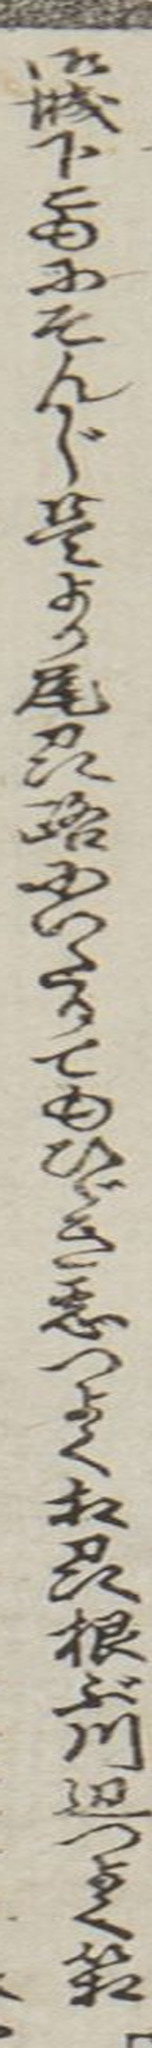御城下ともにそんじ是より尾州路にいたりてもひゞき甚つよく相州根ぶ川辺つよく箱
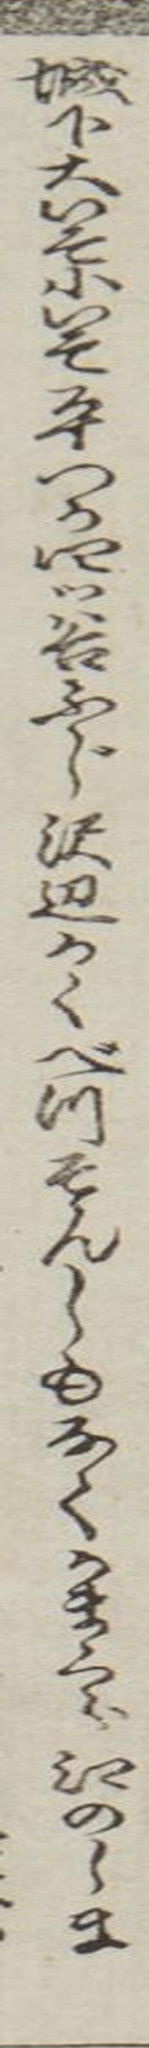城下大いそ小いそ平つか四ッ谷ふじ沢辺かくべつそんしもなくかまくら江のしま
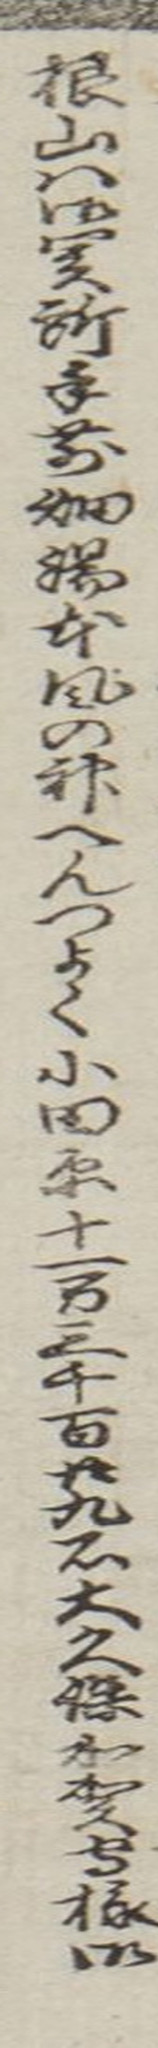根山は御関所手前畑湯本風の神へんつよく小田原十一万三千百廿九石大久保加賀守様御
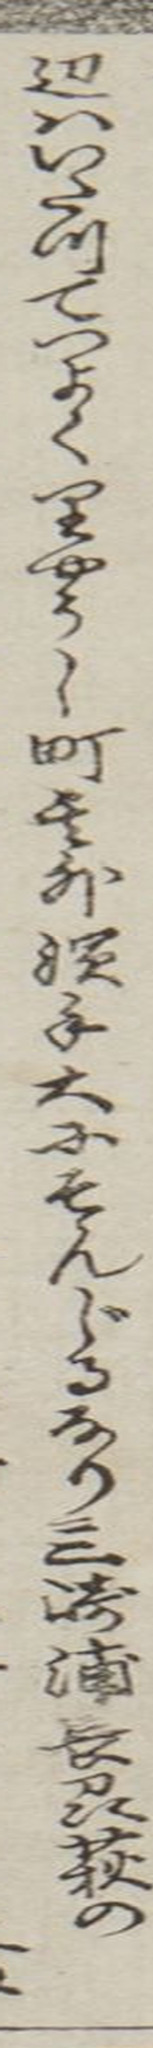辺はいたつてつよくりやうし町其外浜手大にそんじるなり三崎浦長州萩の
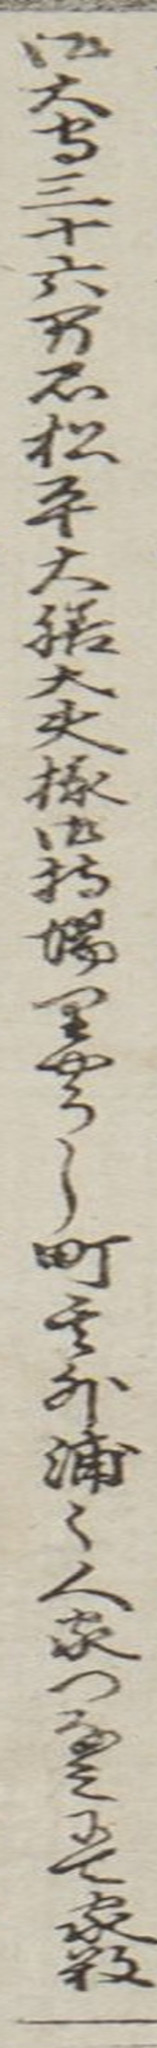御大守三十六万石松平大膳大夫様御持場りやうし町其外浦々人家つなみにて家数
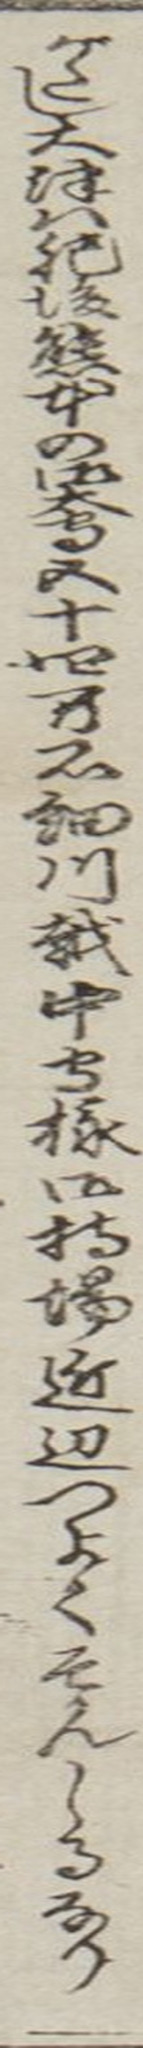がたし大津は肥後熊本の御大守五十四万石細川越中守様御持場近辺つよくそんしるなり
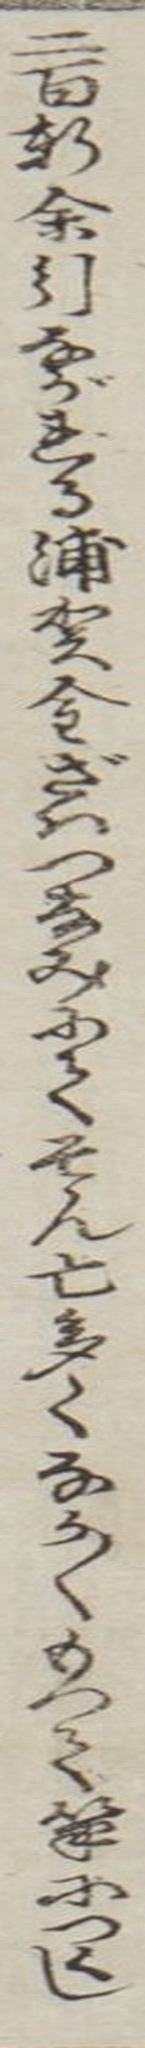二百軒余引ながれる浦賀金ざはつなみにてそん亡多くなか〳〵もつて筆につくし
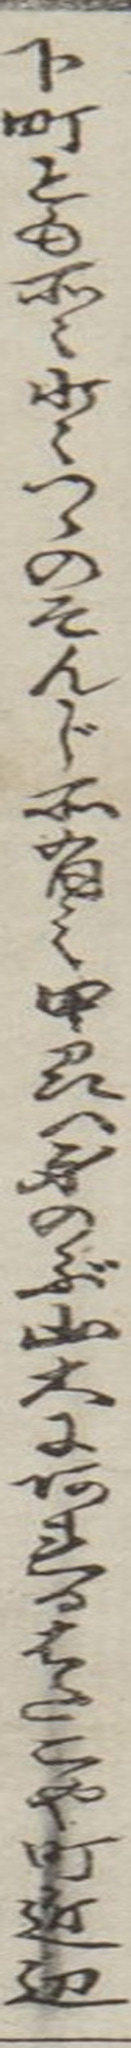下町とも所々少々つゝのそんじ所有て甲州は身のぶ山大にあれるはたこや町近辺
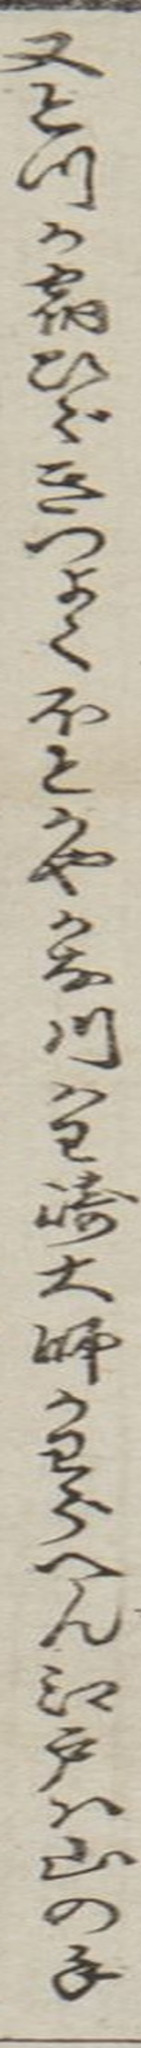又とつか宿ひゞきつよくほとかやかな川かわ崎大師かわらへん江戸は山の手
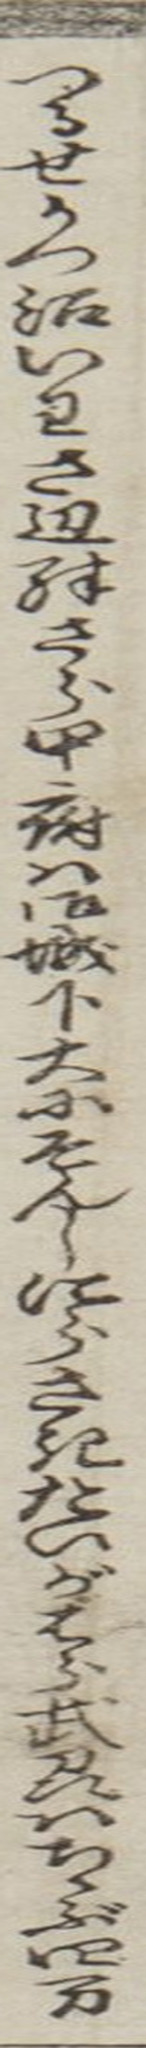つるせかつ沼いわさ辺殊さら甲府は御城下大にそんしにらさきたいがはら武州はちゝぶ四万
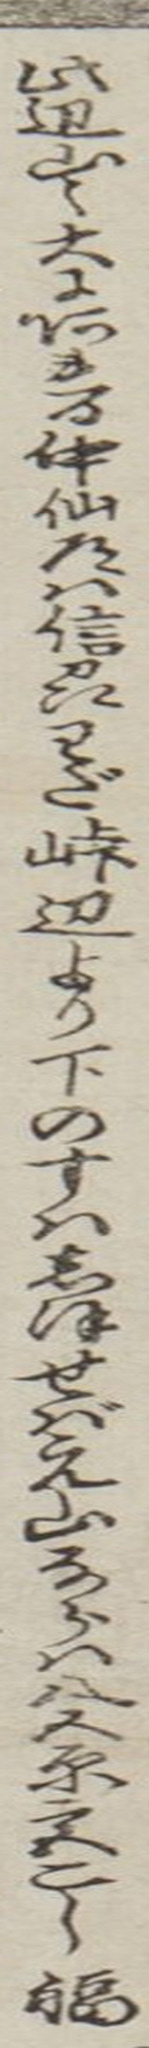此辺山々大にあれる中仙道は信州わだ峠辺より下のすはしほせば元山ならは八五原宮こし福
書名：十箇国大地震の図
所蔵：あいおいニッセイ同和損保株式会社
